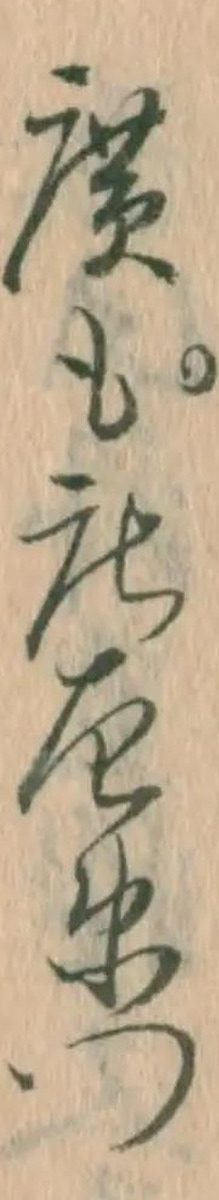広も庄左衛門
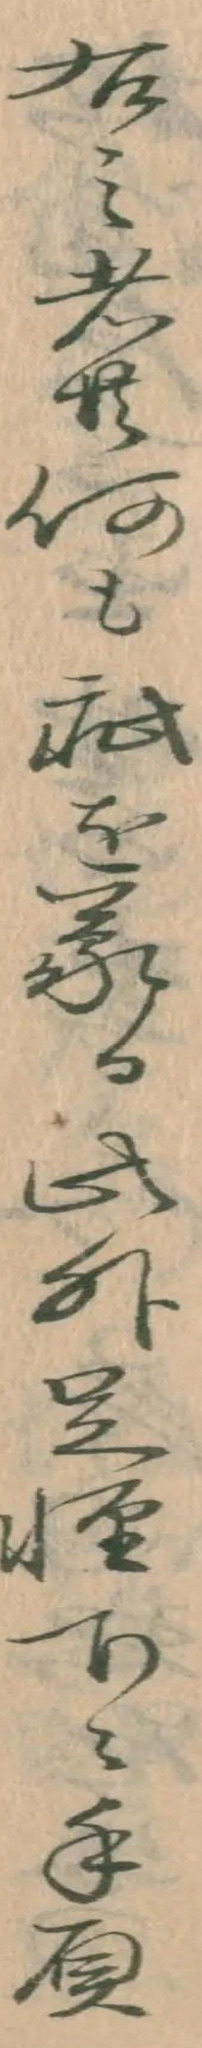右の者共何も疵を承る此外足軽下々手負
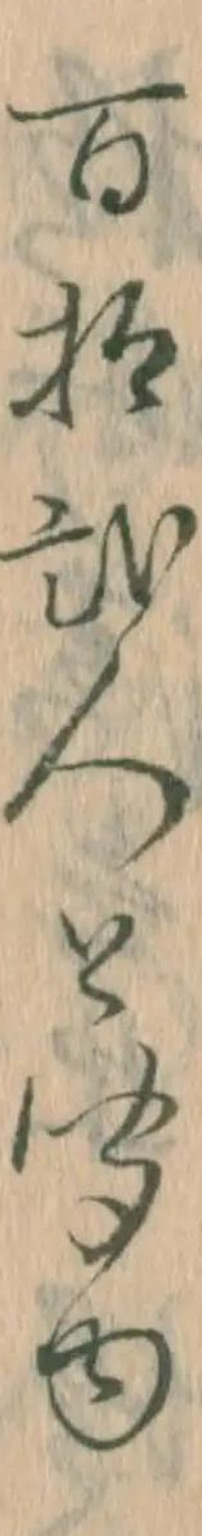百拾弐人と聞内
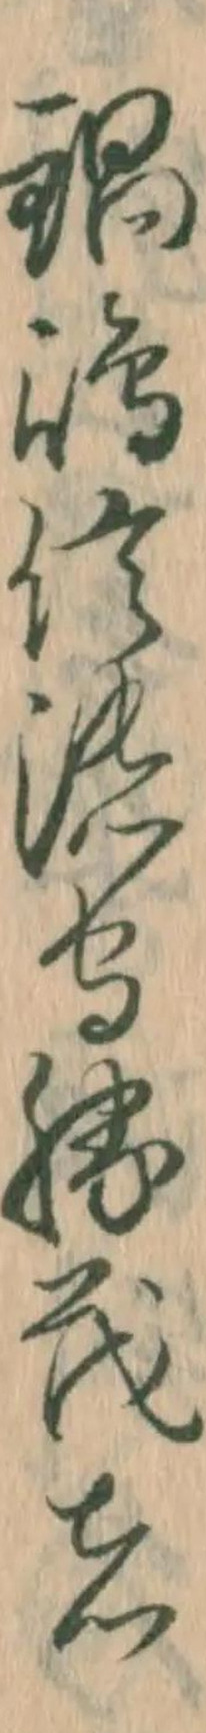鍋島信濃守勝茂者
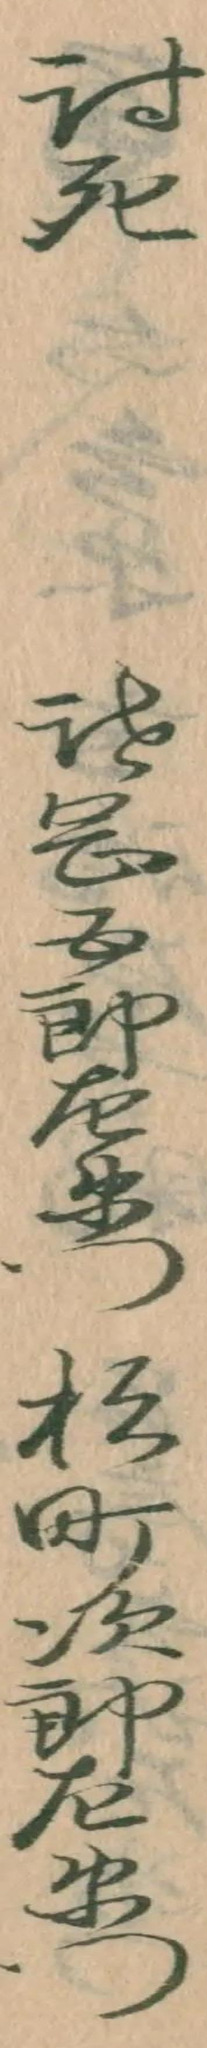討死諸岡五郎左衛門杉町次郎左衛門
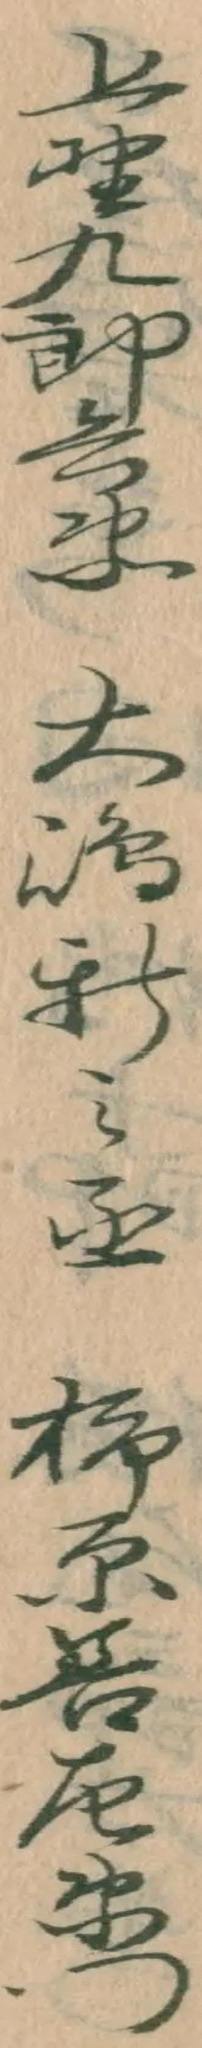上野九郎兵衛大島新之丞柿原善左衛門
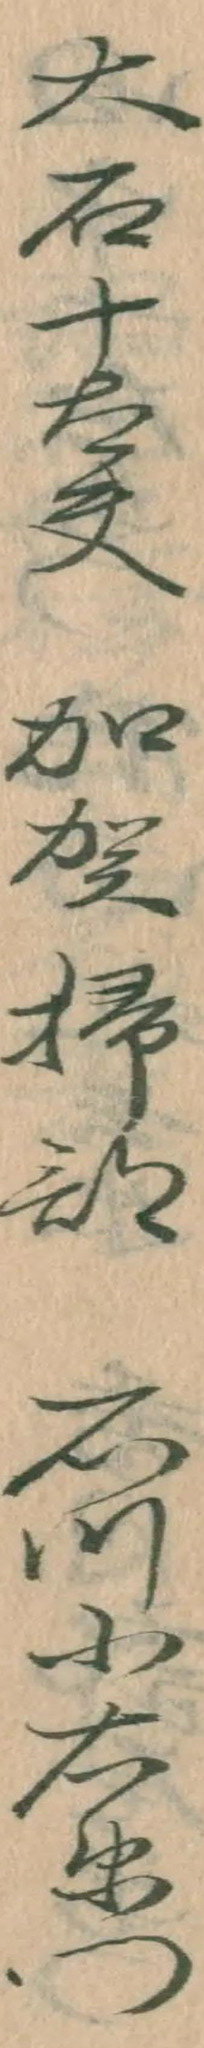大石十太夫加賀掃部石川小右衛門
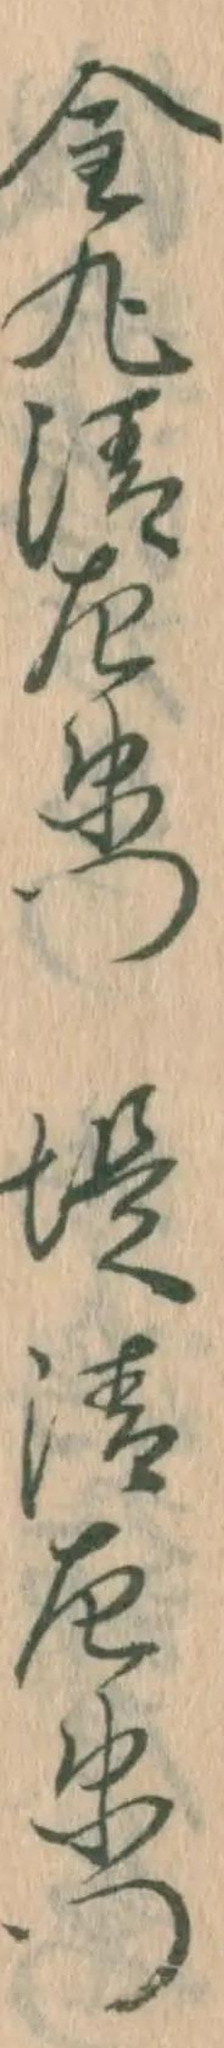金丸清左衛門堤清左衛門
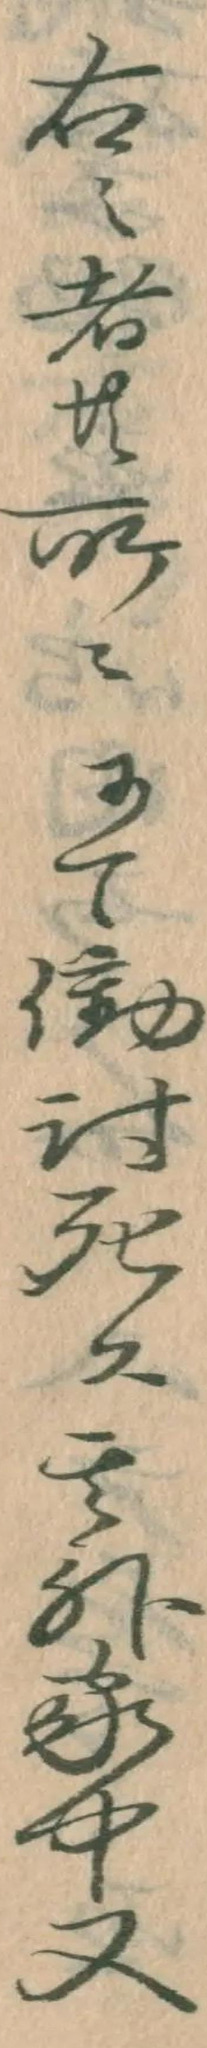右之者共所々尓て働討死す其外家中又
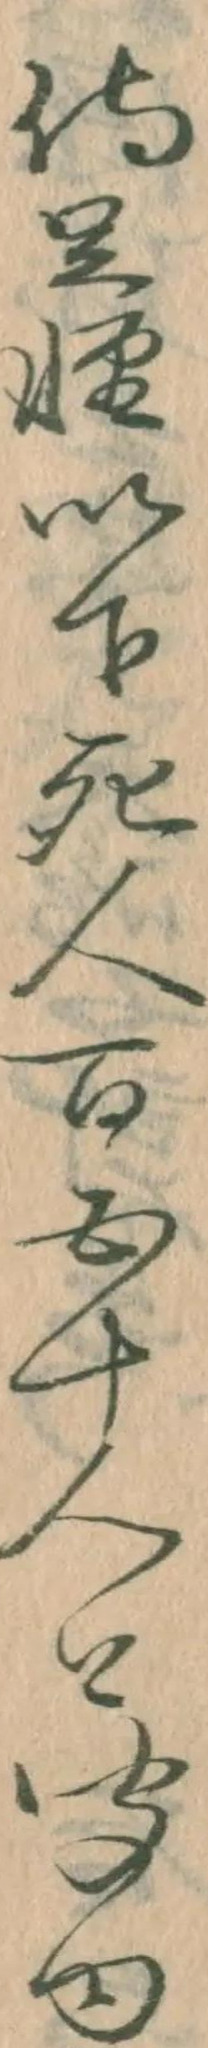侍足軽以下死人百五十人と聞内
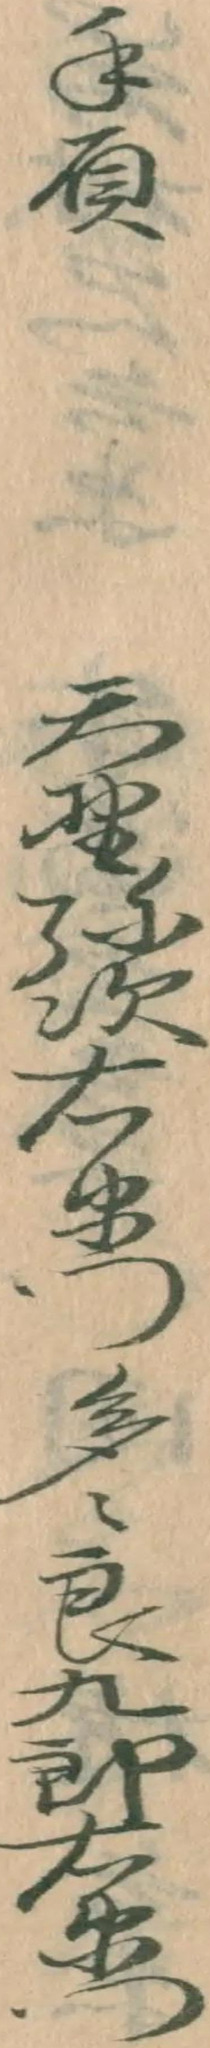手負天野弥右衛門多々良九郎右衛門
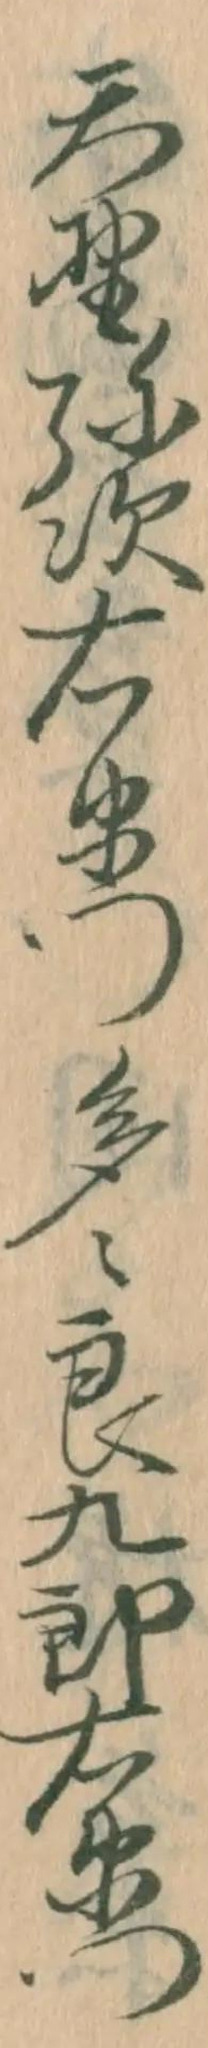手負天野弥右衛門多々良九郎右衛門

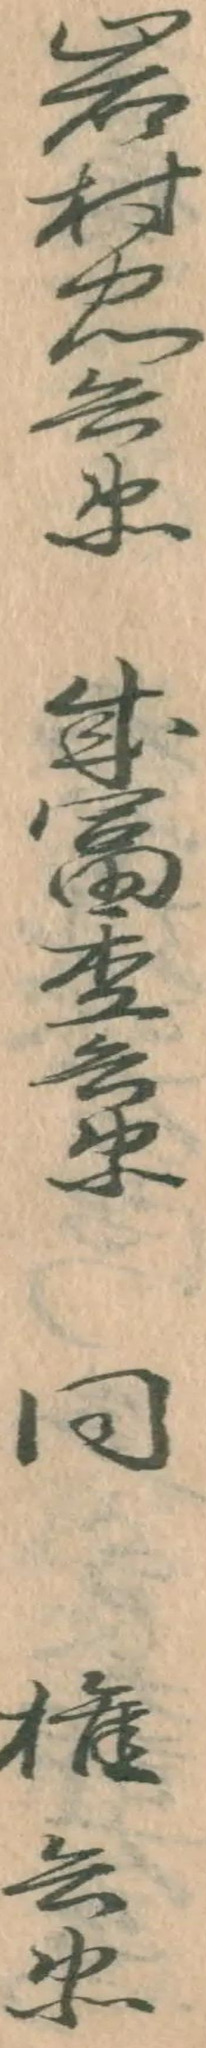岩村忠兵衛成冨杢兵衛同権兵衛
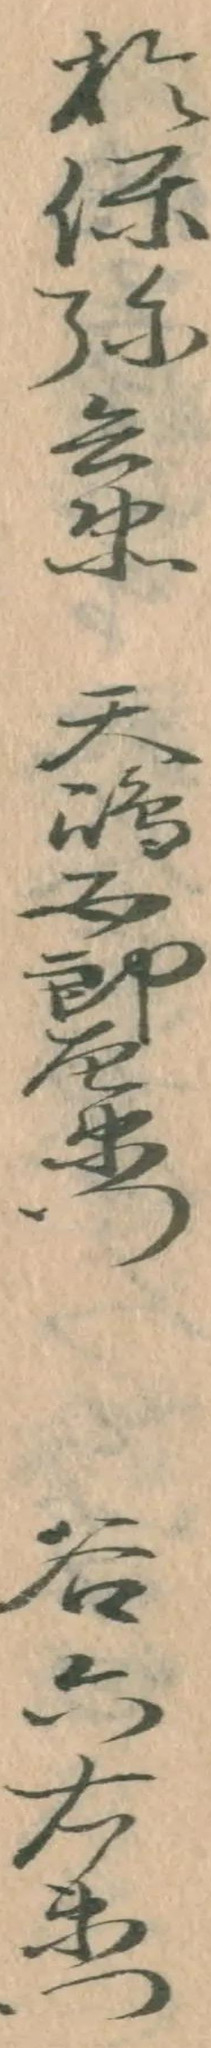於保孫兵衛天島五郎左衛門谷六右衛門
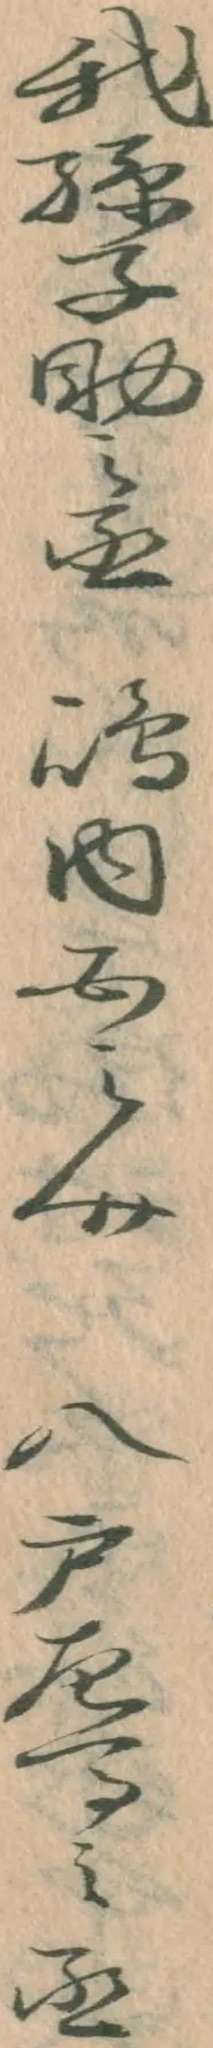我孫子助之丞島内五之介八戸左馬之丞
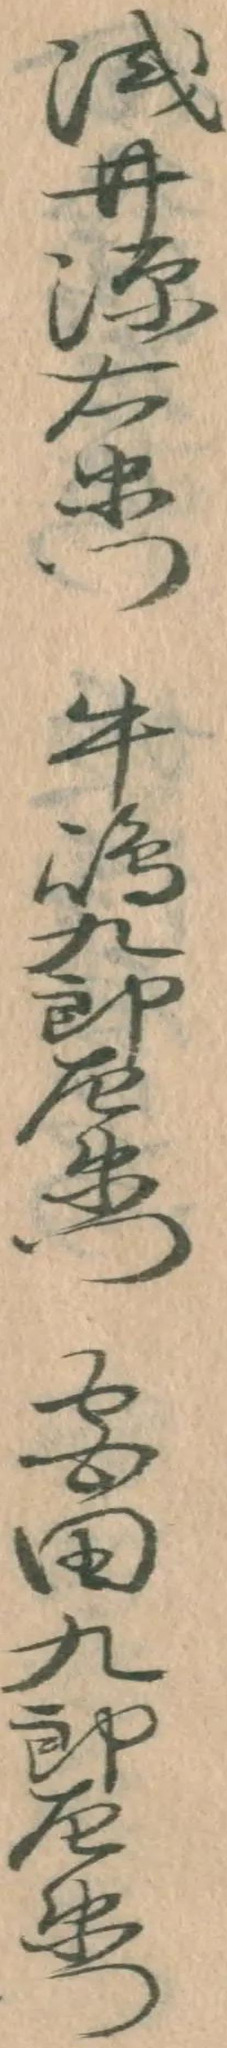浅井源右衛門牛島九郎左衛門宮田九郎左衛門
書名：切支丹御退治記 49巻. [9]
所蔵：国立国会図書館 National Diet Library, JAPAN
